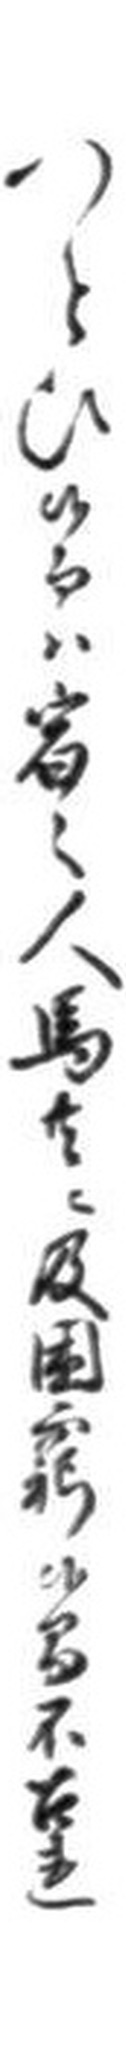つとひ候而ハ宿之人馬共ニ及困窮候間不召連
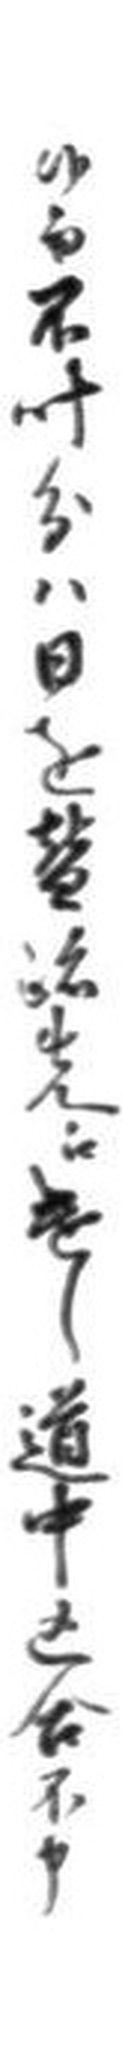候而不叶分ハ日を替跡先江遣し道中込合不申
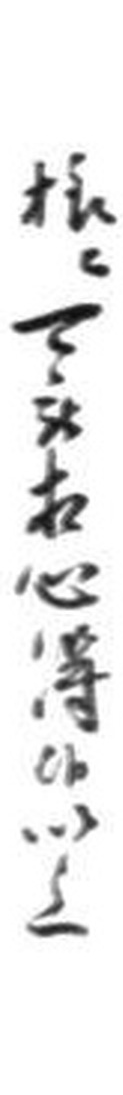様ニ可被相心得候以上
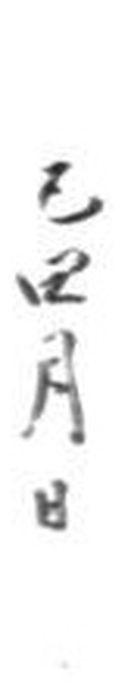巳四月日
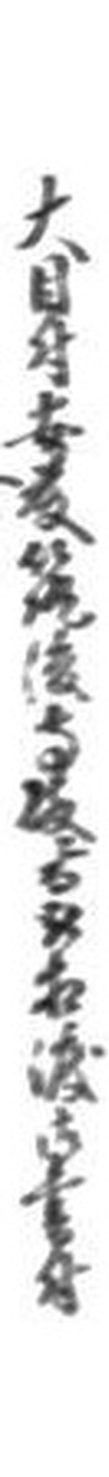大目付安藤筑後守殿ゟ被相渡御書付
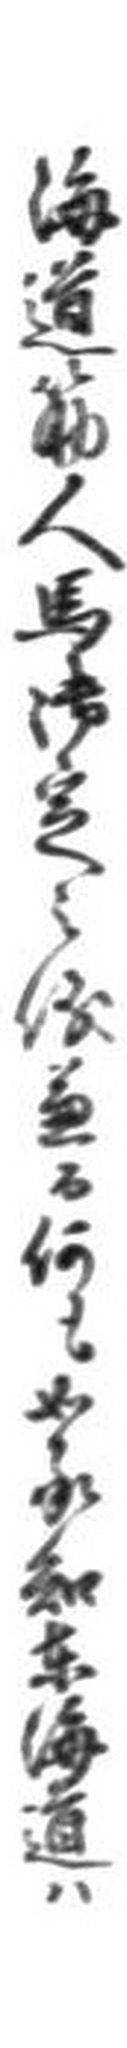街道筋人馬御定之儀兼而何も如承知東海道ハ
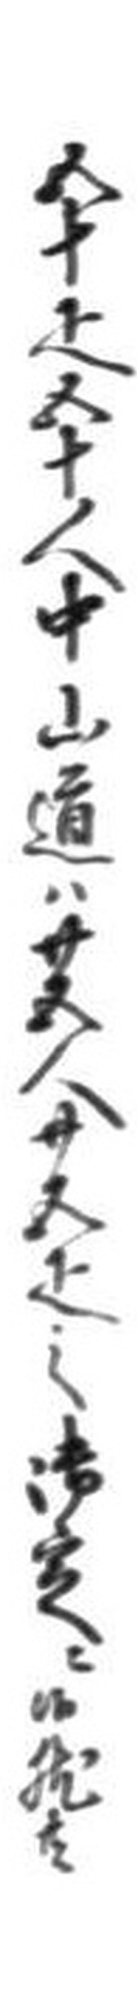五十疋五十人中山道ハ廿五人廿五疋之御定ニ候然共
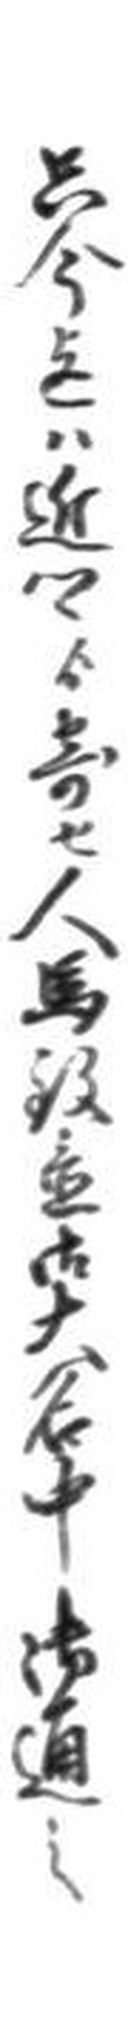只今迄ハ近郷ゟ寄セ人馬致置御大名中御通之

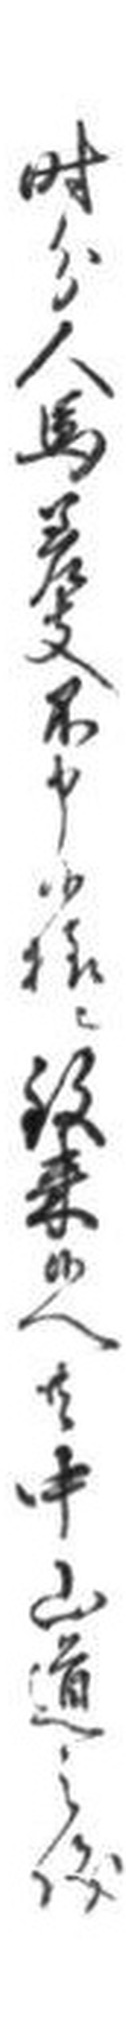時分人馬差支不申候様ニ致来候ヘ共中山道之儀
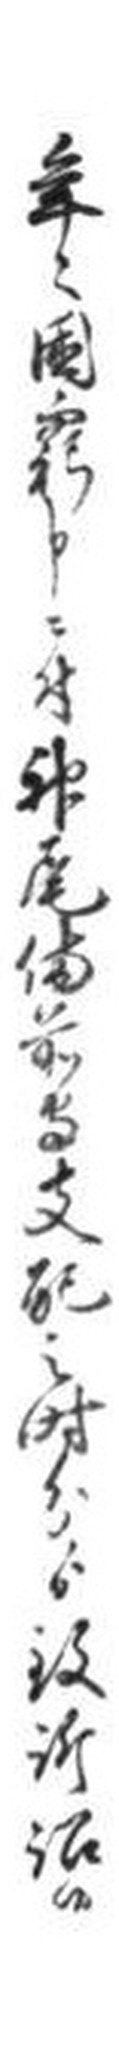年々困窮申ニ付神尾備前守支配之時分ゟ致訴訟候
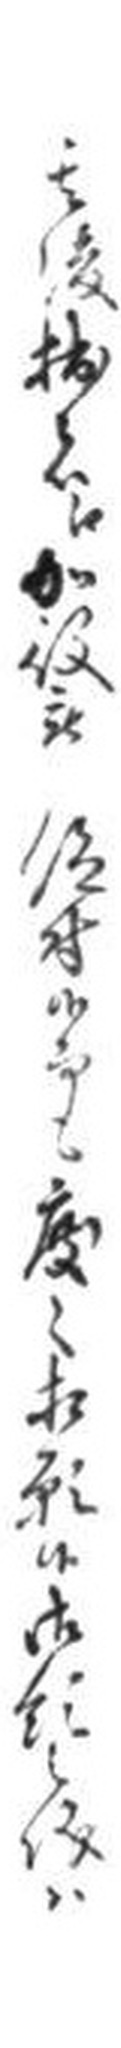其後拙者江加役被仰付候而も度々相願候御領之儀ハ
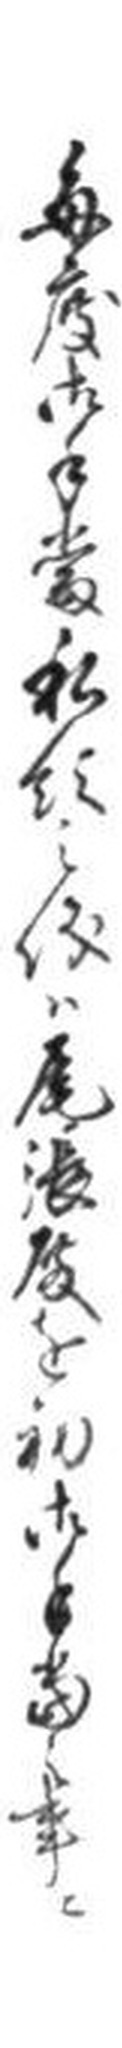毎度御手当私領之儀ハ尾張殿を初御手当之事ニ
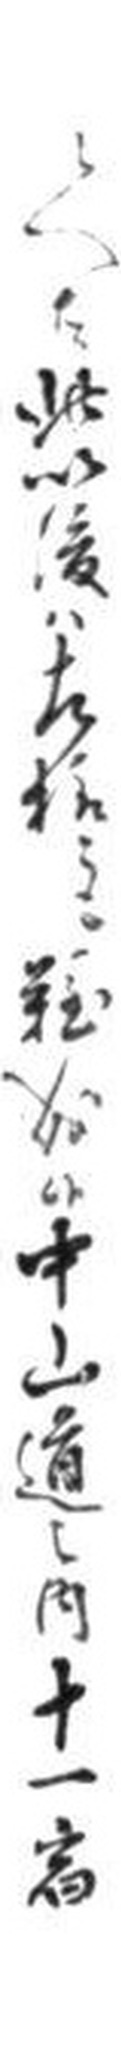候へ共此以後ハ左様二も難成候中山道之内十一宿
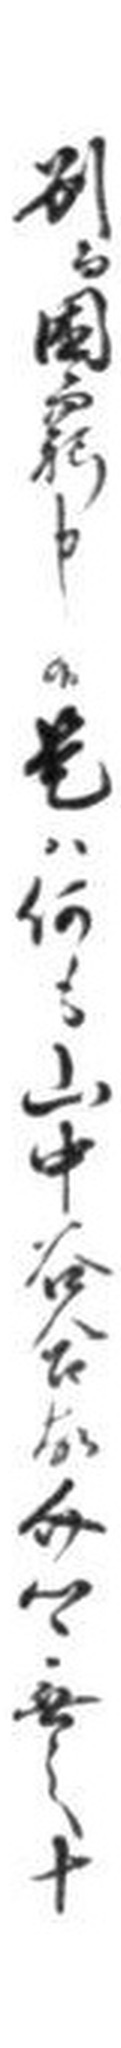別而困窮申候是ハ何も山中谷合故介郷無之十
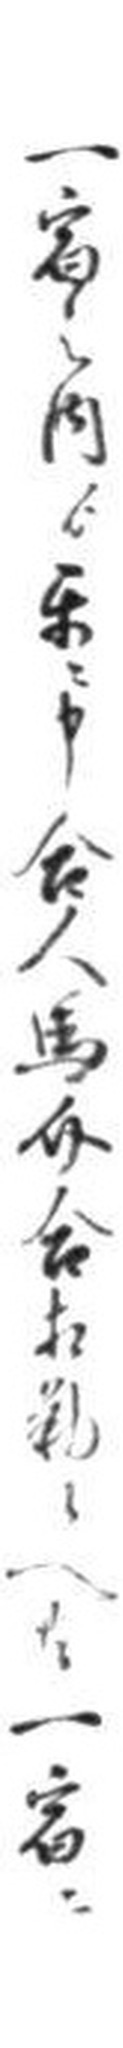一宿之内ゟ互ニ申合人馬介合相勤候へ共一宿ニ
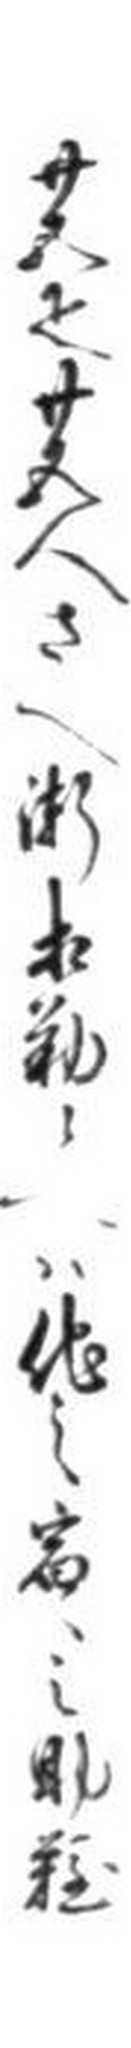廿五疋廿五人さへ漸相勤候へハ他之宿へ之助難
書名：家譜 二十一 吉品公 従元禄十三年到同十四年
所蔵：福井県文書館 Fukui Prefectural Archives
